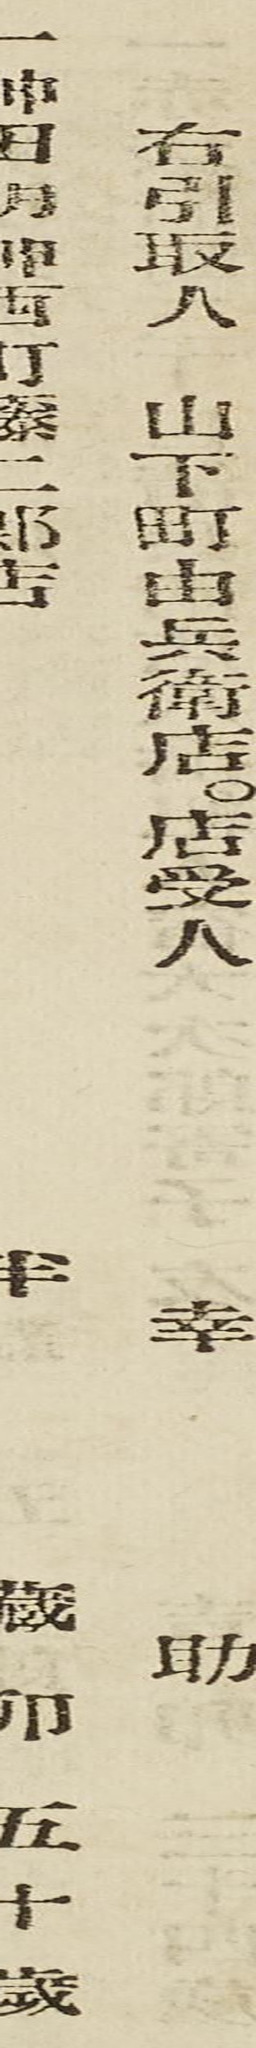一神田明神西町藤二郎店半蔵卯五十歳
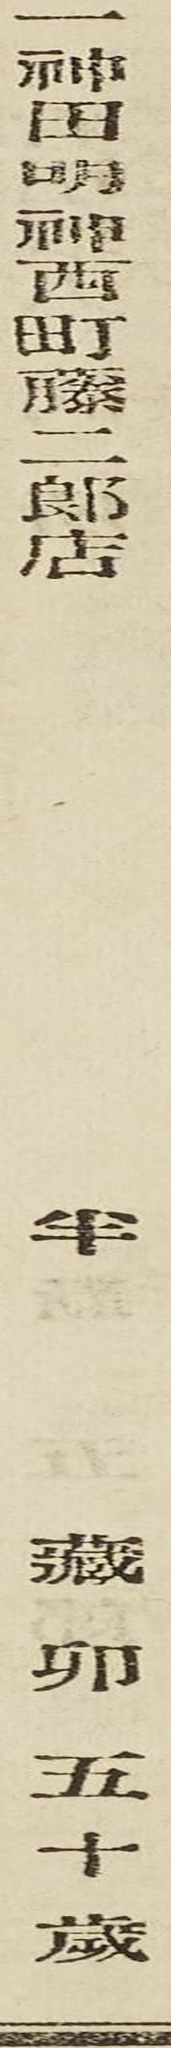一神田明神西町藤二郎店半蔵卯五十歳
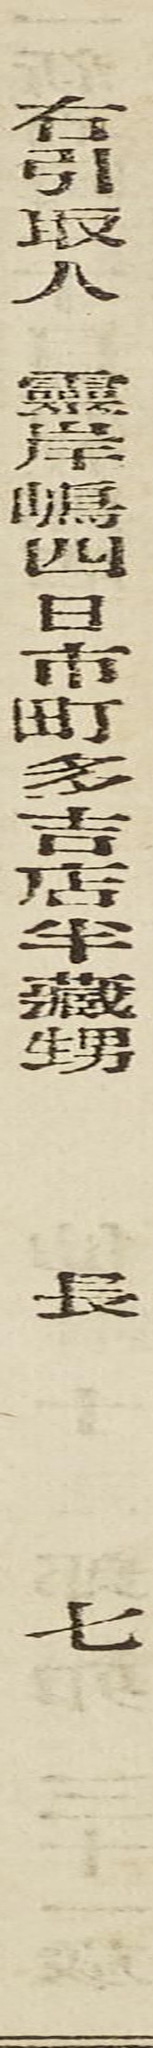一右引取人霊岸嶋四日市町多吉店半蔵甥長七
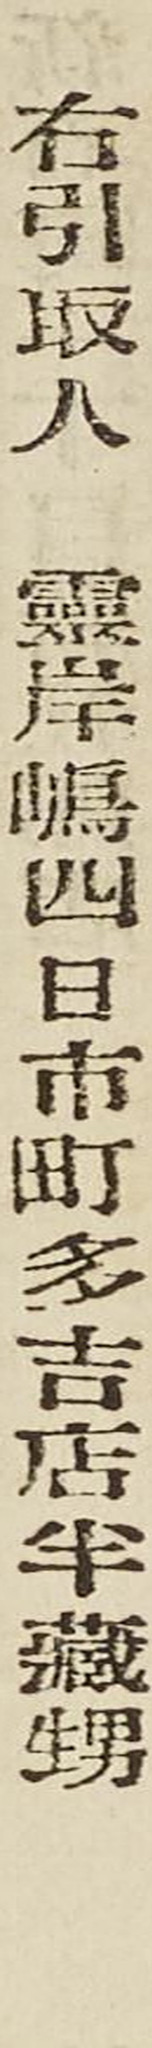一右引取人霊岸嶋四日市町多吉店半蔵甥長七
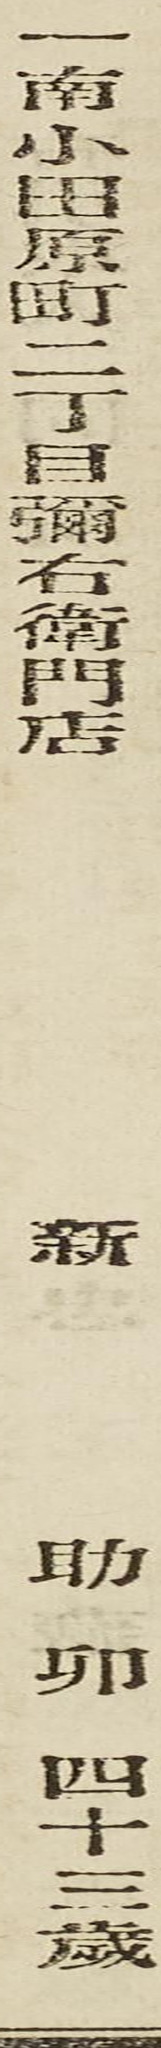一南小田原町二丁目弥右衛門店新助卯四十三歳
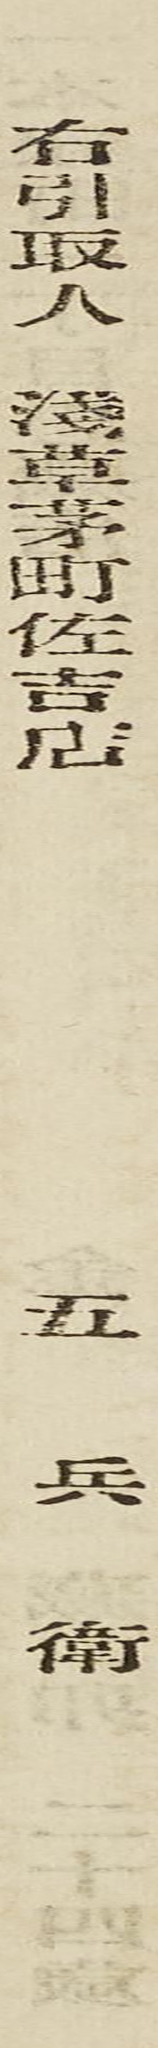右引取人浅草茅町佐吉店五兵衛
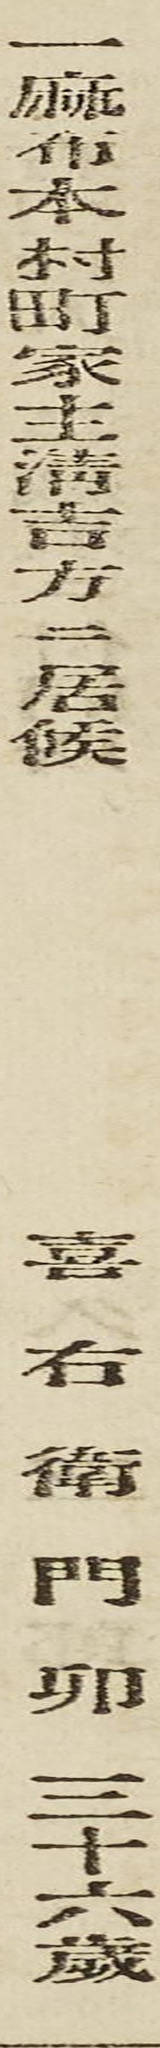一麻布本村町家主清吉方ニ居候喜右衛門卯三十六歳
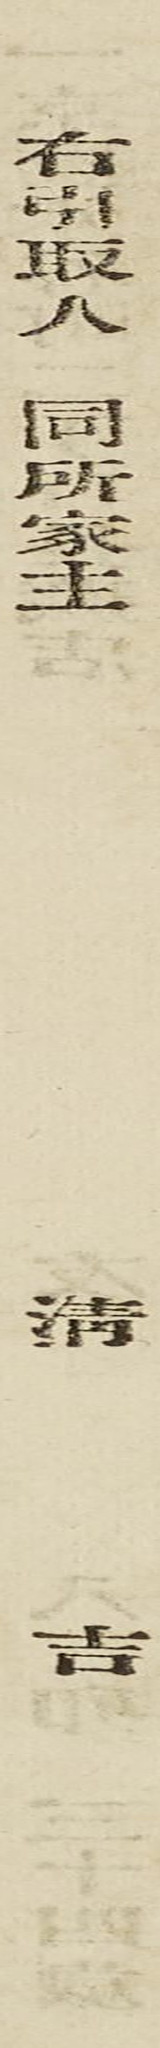右引取人同所家主清吉
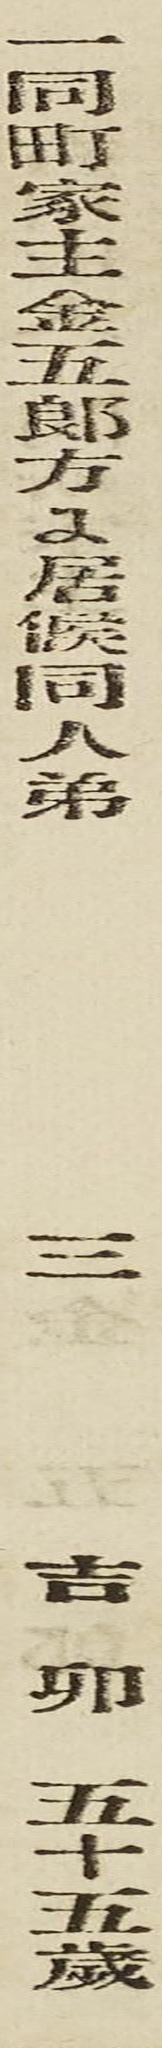一同町家主金五郎方に居候同人弟三吉卯五十五歳
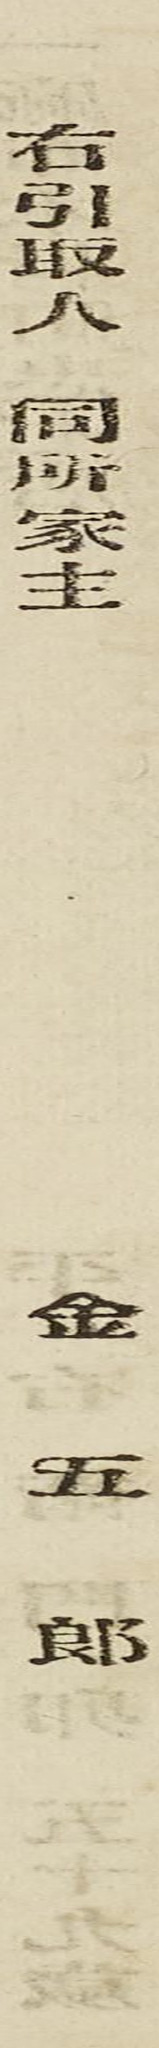右引取人同所家主金五郎
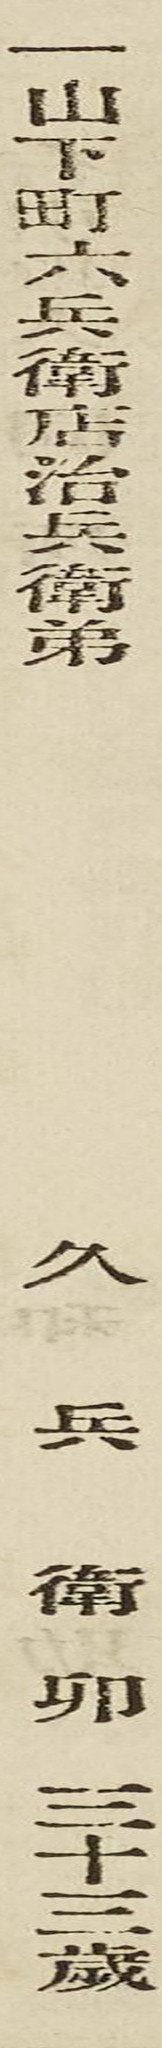一山下町六兵衛店治兵衛弟久兵衛卯三十三歳
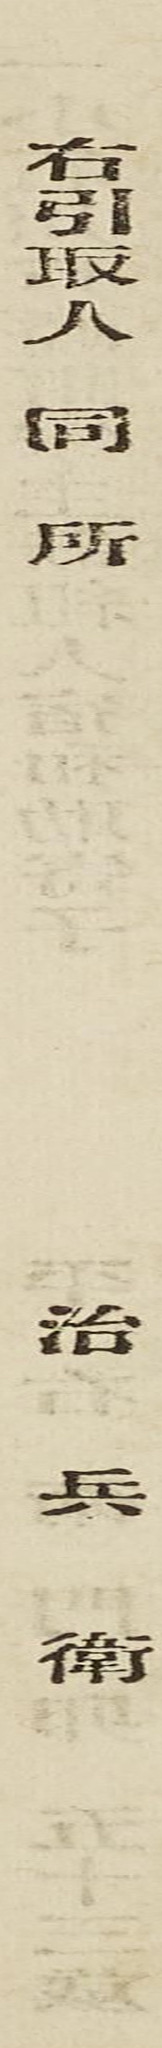右引取人同所治兵衛
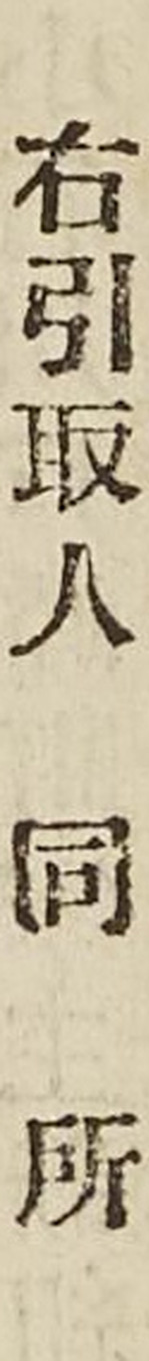右引取人同同
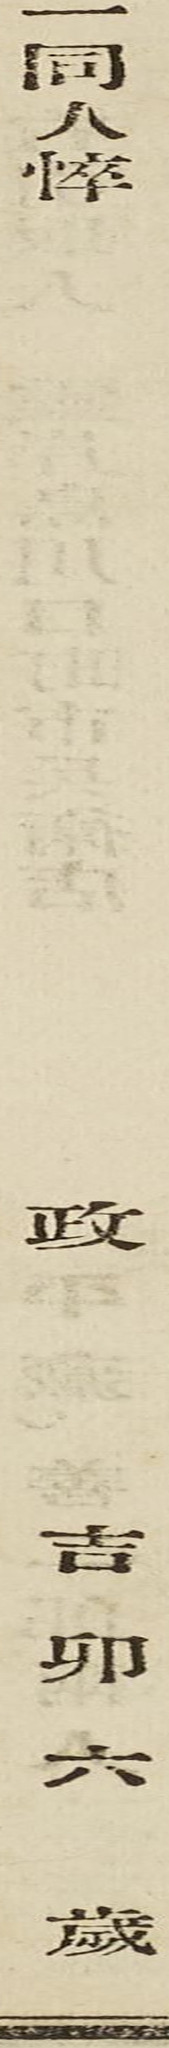一同人倅政吉卯六歳
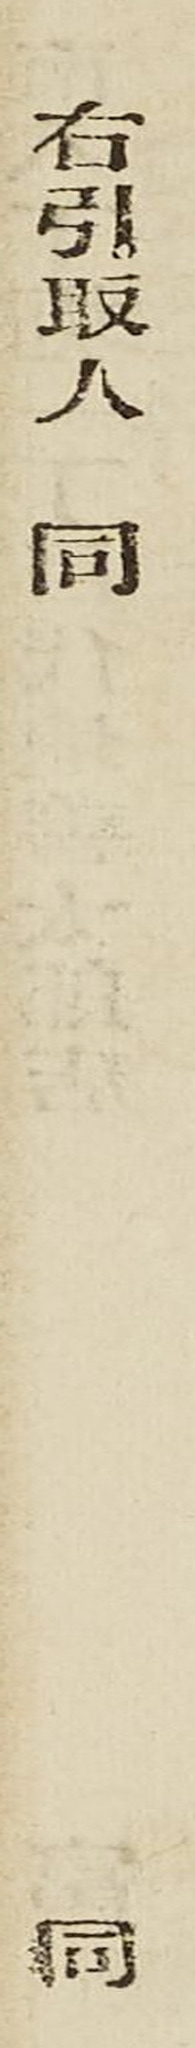右引取人同同
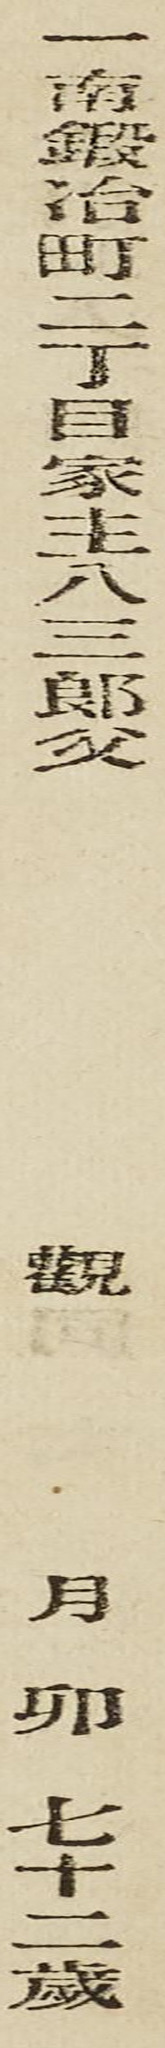一南鍛冶町二丁目家主八三郎父観月卯七十二歳
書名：永代惨話　文化の夢　全
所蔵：東京大学地震研究所図書室 Earthquake Research Institute Library, The University of Tokyo, JAPAN
